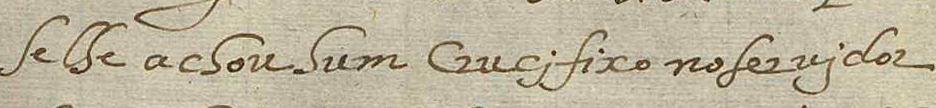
se lhe achou hum crucjfixo no serujdor
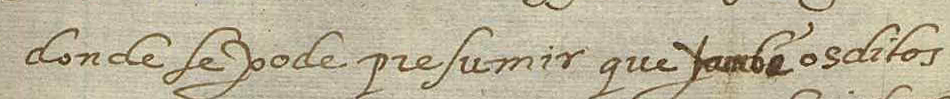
donde se pode presumir que tambē os ditos
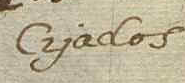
Crjados
